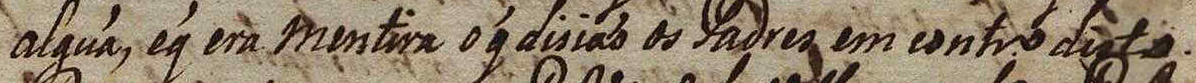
algūa, e q̄ era Mentira o q̄ disião os Padres em contr.o disto.
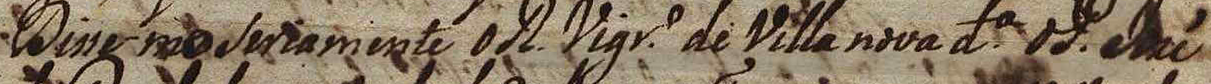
Disse-mo seriamente o R. Vigr.o de Villa nova d̄.a O P. Iozé
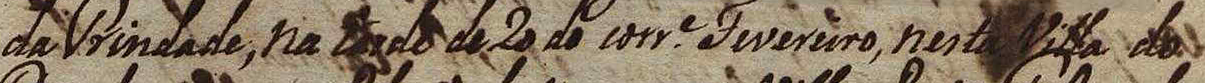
da Trindade, na tarde de 20 do corr.e Fevereiro, nesta Villa do
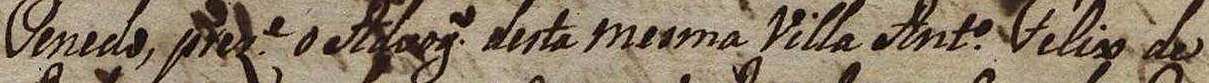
Penedo, prez.e o Advog.o desta mesma Villa Ant.o Felix de
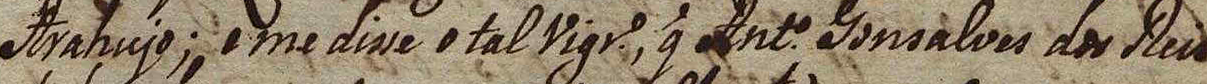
Arahujo; e me disse o tal Vigr.o, q̄ Ant.o Gonsalves dos Reis
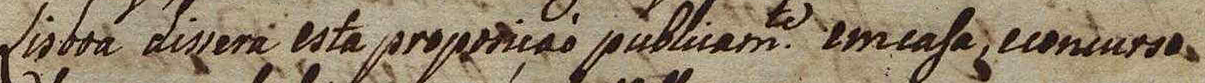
Lisboa dissera esta proposiçaõ publicam.te em casa, e concurso
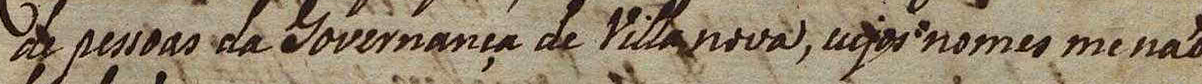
de pessoas da Governança de Villa nova, cujos nomes me naõ
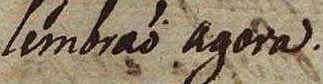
lembraõ agora.
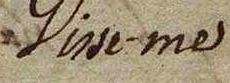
Disse-me
